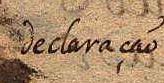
declaraçaõ
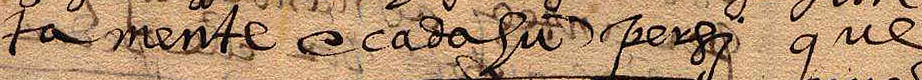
tamente e cada hū per sj que
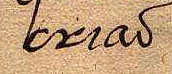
criaõ
